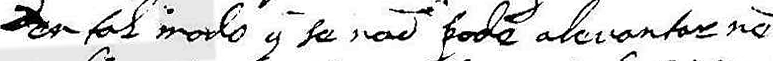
en tal modo q̄ se não pode alevantar nẽ
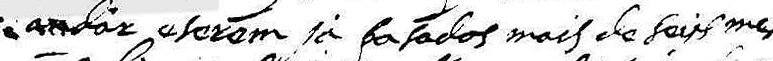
andar e serem já pasados mais de seis meses
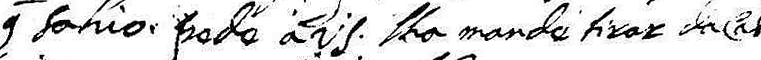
q̄ sahio, pede a V.S. lha mande tirar da Casa
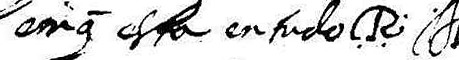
em q̄ esta en tudo R.M.
